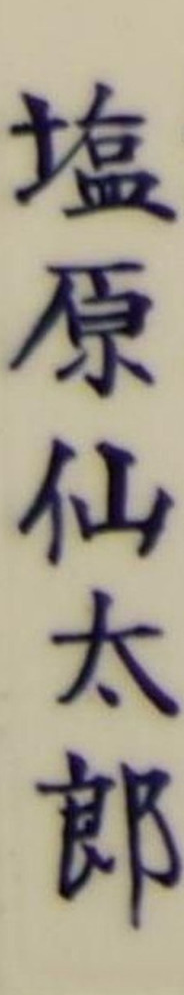塩原仙太郎

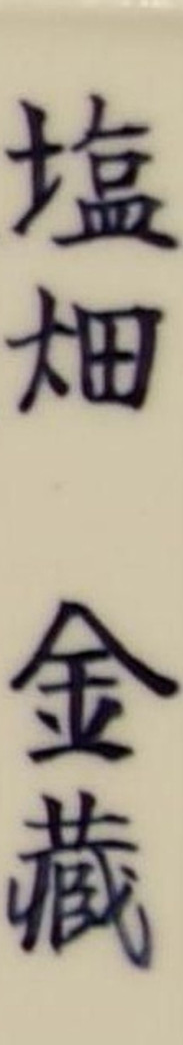塩畑金蔵
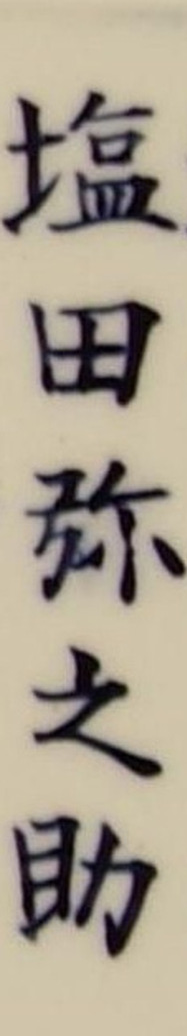塩田弥之助
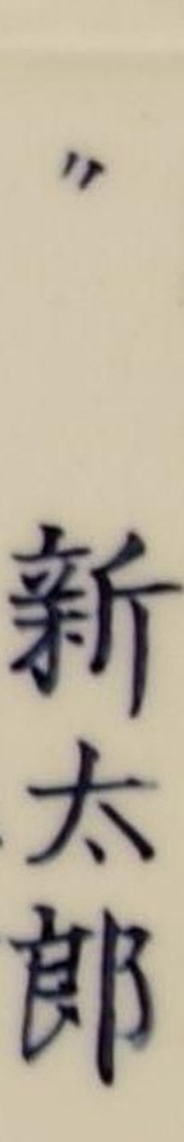新太郎
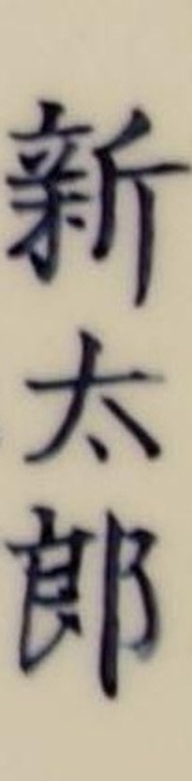新太郎
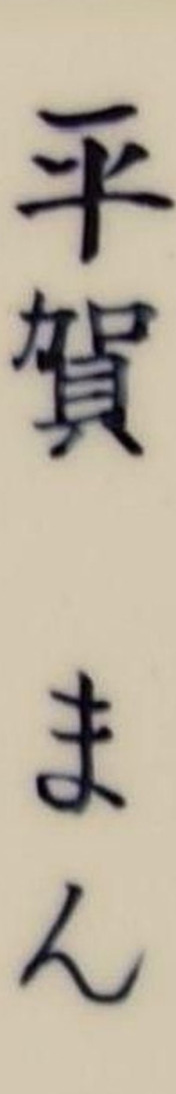平賀まん
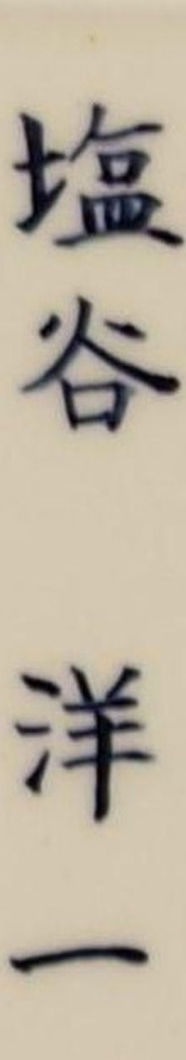塩谷洋一
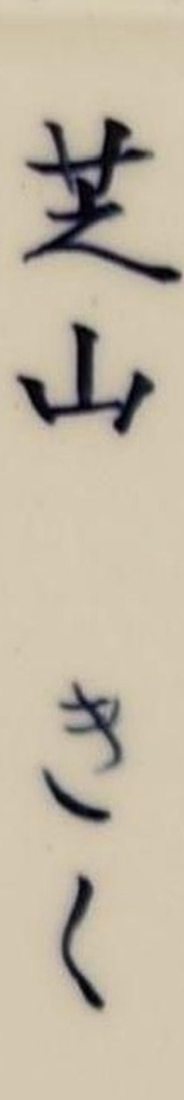芝山きく
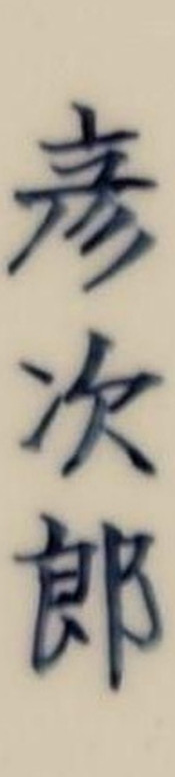彦次郎
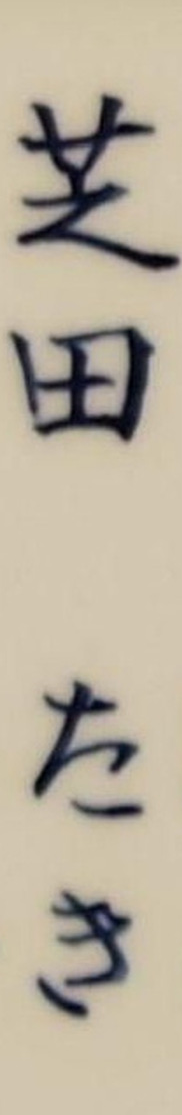芝田たき
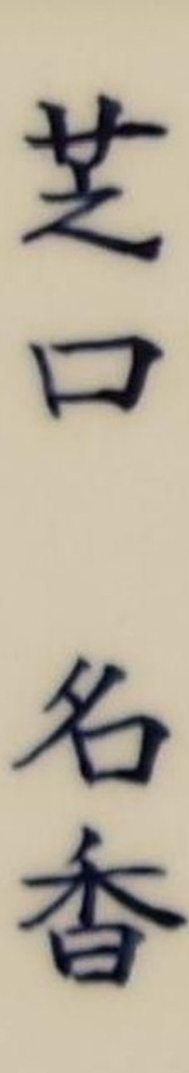芝口名香
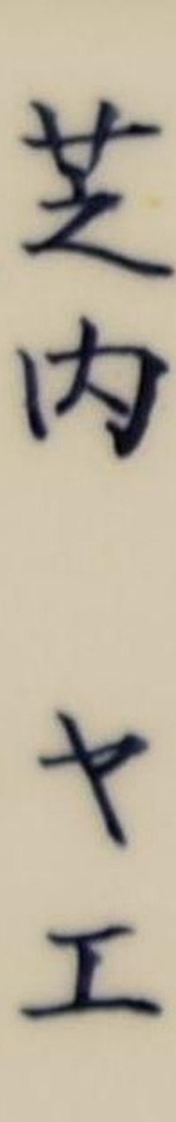芝内ヤエ
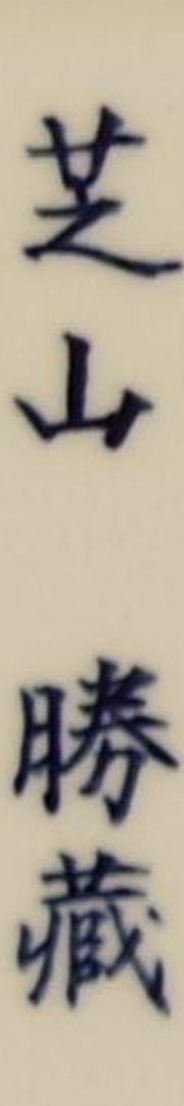芝山勝蔵
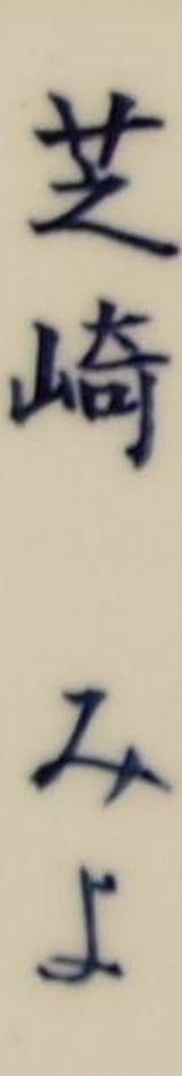芝崎みよ
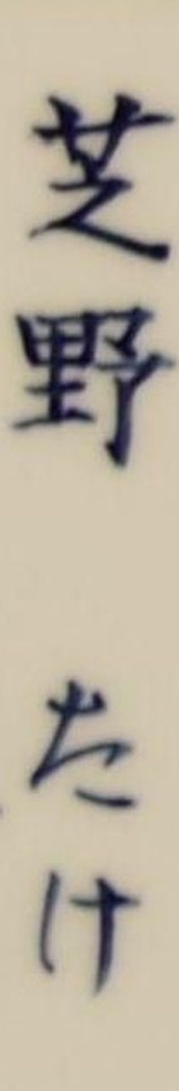芝野たけ
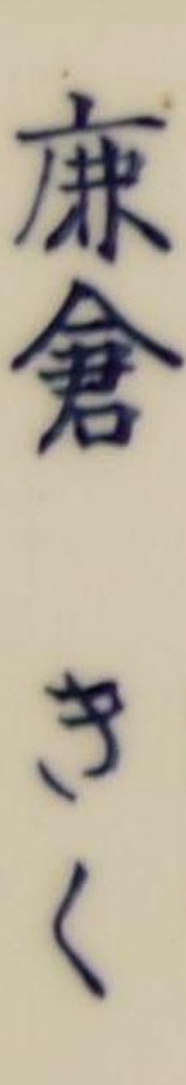鹿倉きく
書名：A~D
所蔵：koyasan kongobuji
